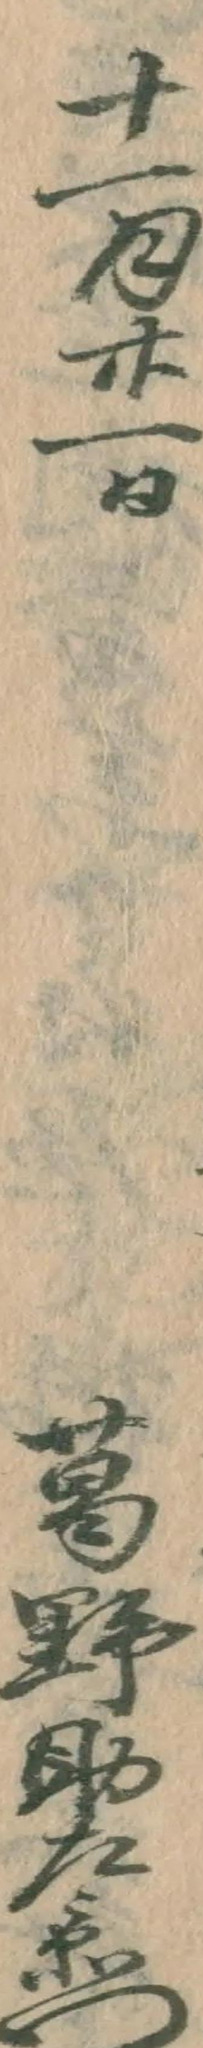十一月廿一日葛野助左衛門
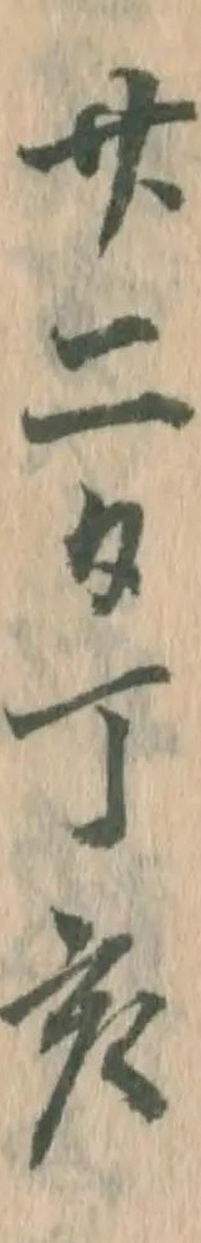廿二日丁亥
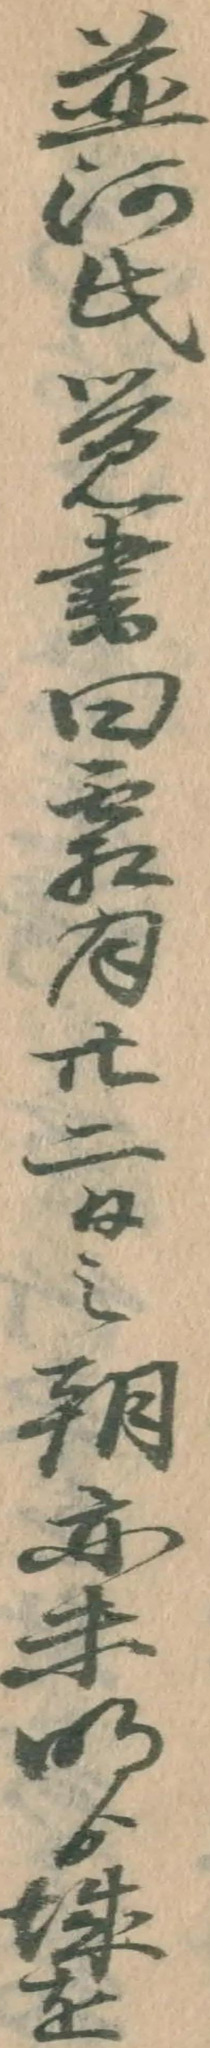並河氏覚書曰霜月廿二日之朝亦未明ゟ城を
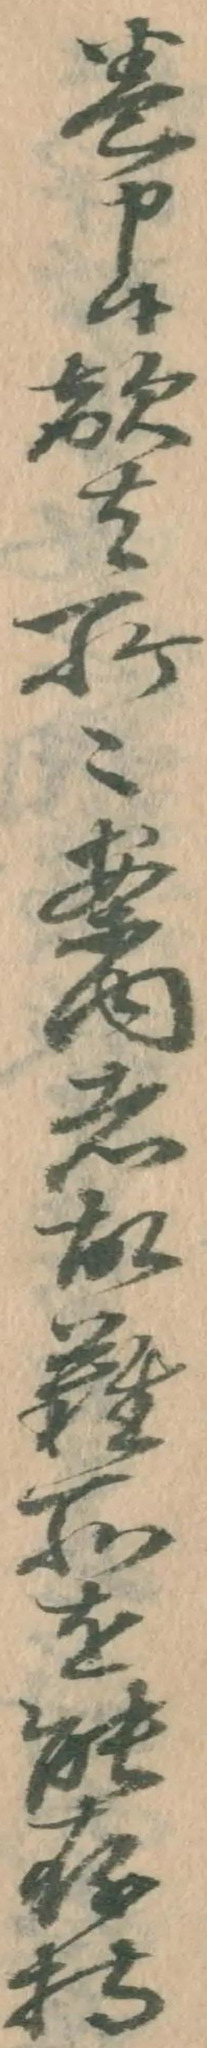巻申候敵は所々案内者故難所を能存持

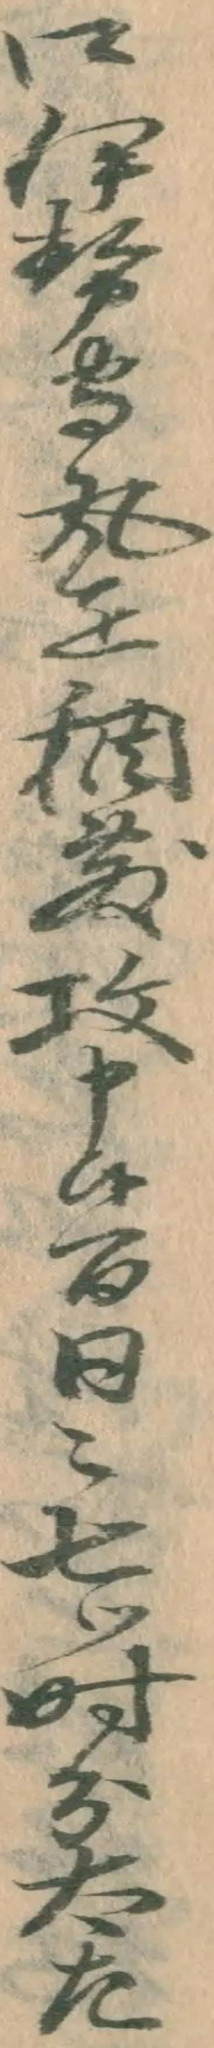口伊勢守丸を稠敷攻申候間日々七ッ時分太左
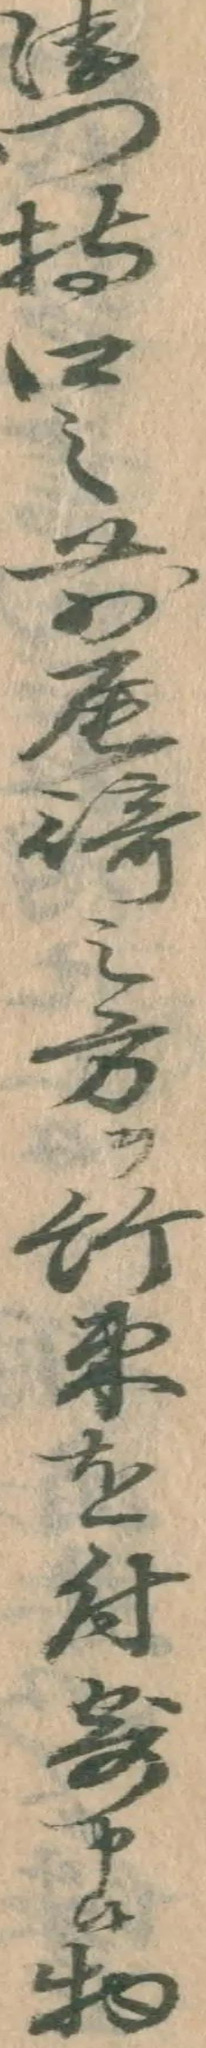衛門持口之前尾崎之方ヲ竹束を付寄申候物
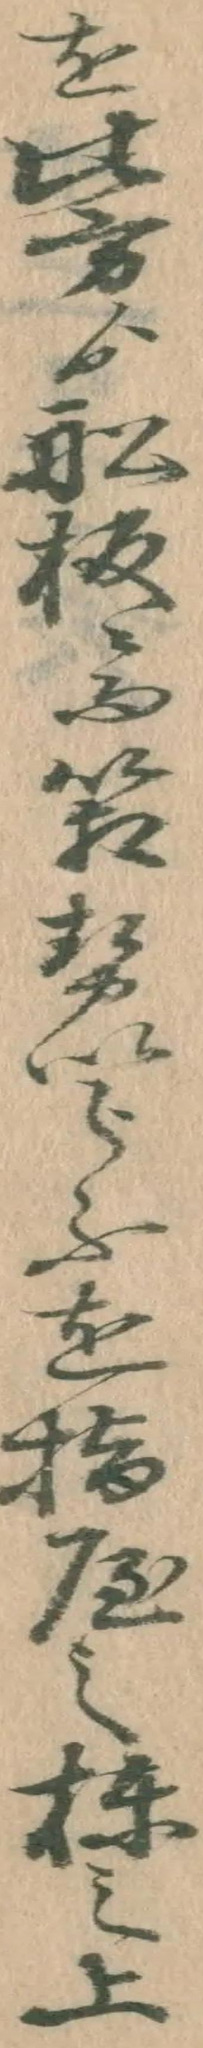を此方ゟ船板に而箱せいらふを指屋之棟之上
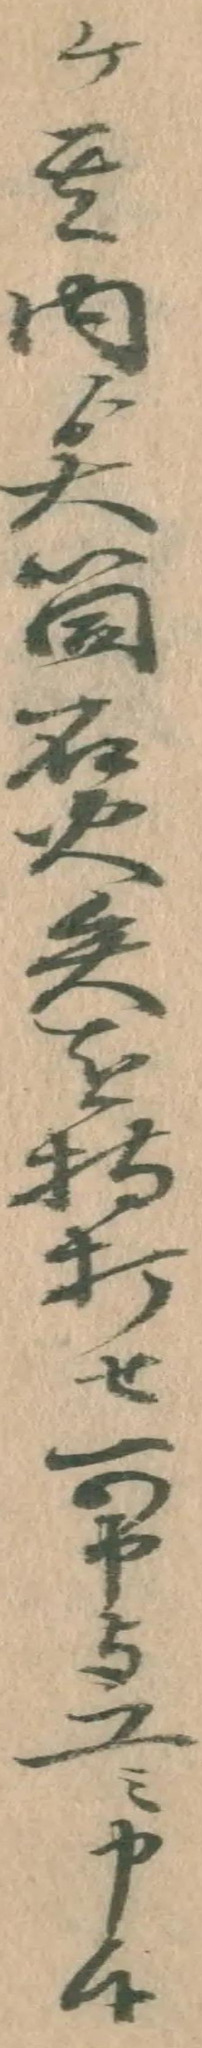ケ其内ゟ大筒石火矢を持打せ可申と工み申候
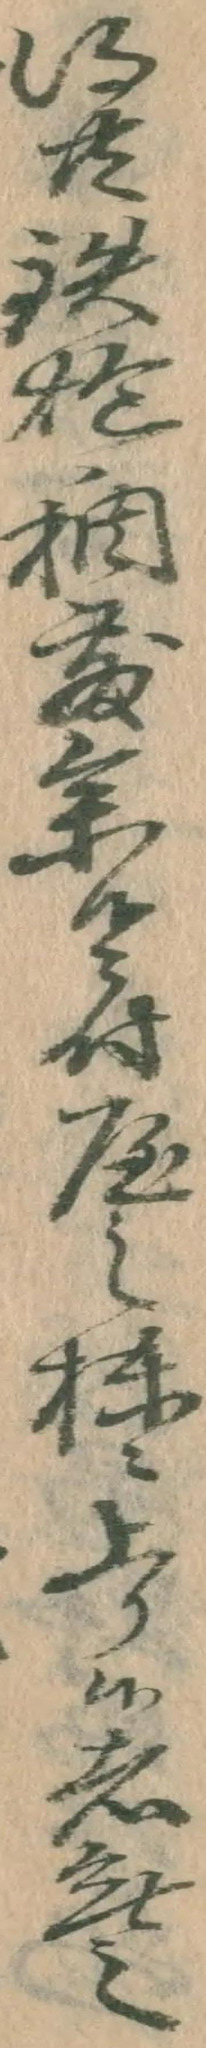得共鉄炮稠敷参候に付屋之棟に上り候者斗之
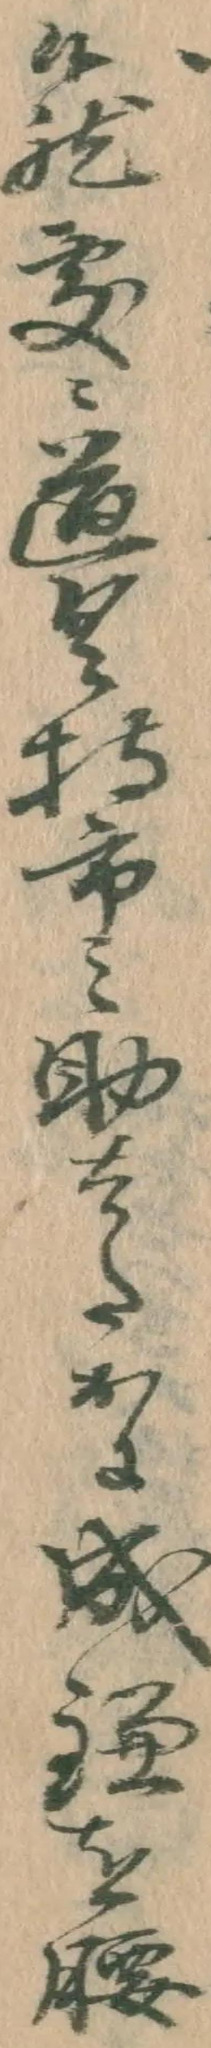候然処に道具持市之助はたかに成鎌を腰
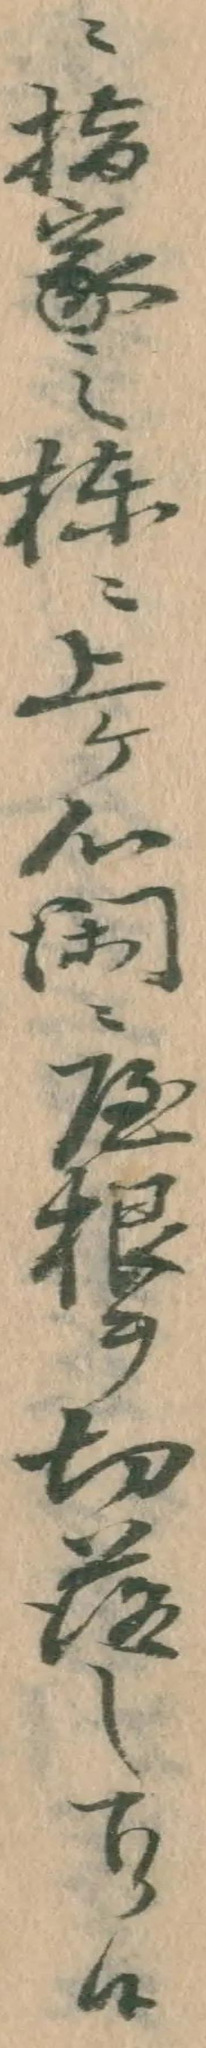に指家之棟に上ケ心閑に屋根ヲ切落し下り候
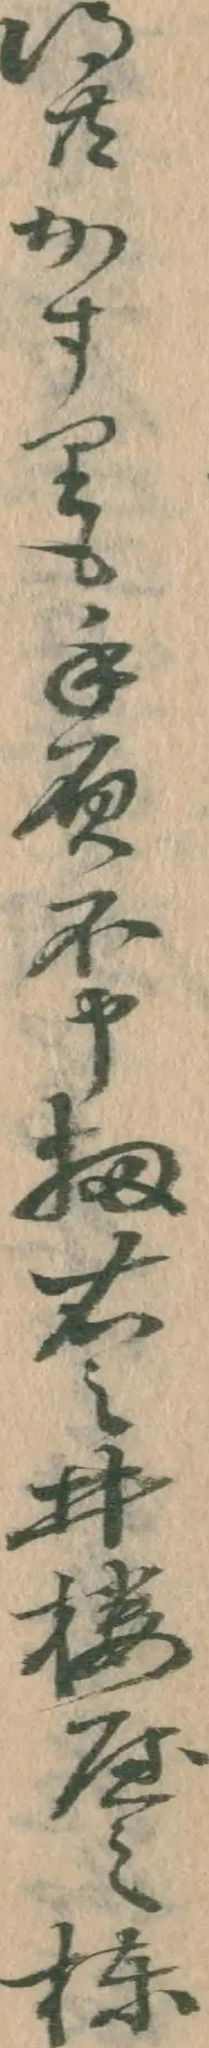得共かすりも手負不申扨右之井楼屋之棟
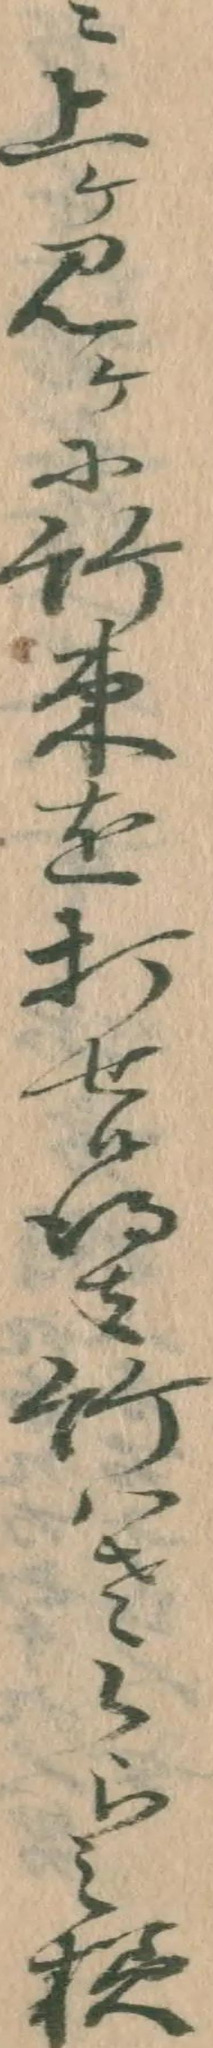に上ケ見ケに竹束を打せ候得は竹はさららみ様
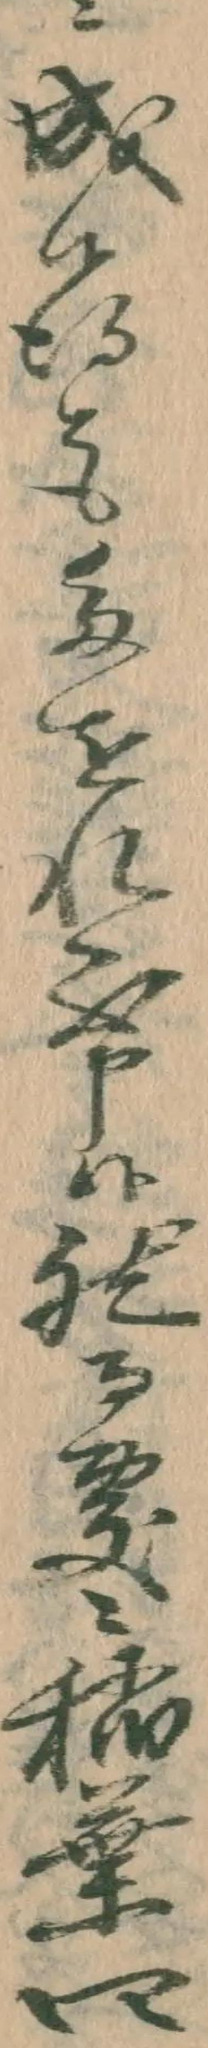に成候得ともたをれ不申候然る処に稲葉四
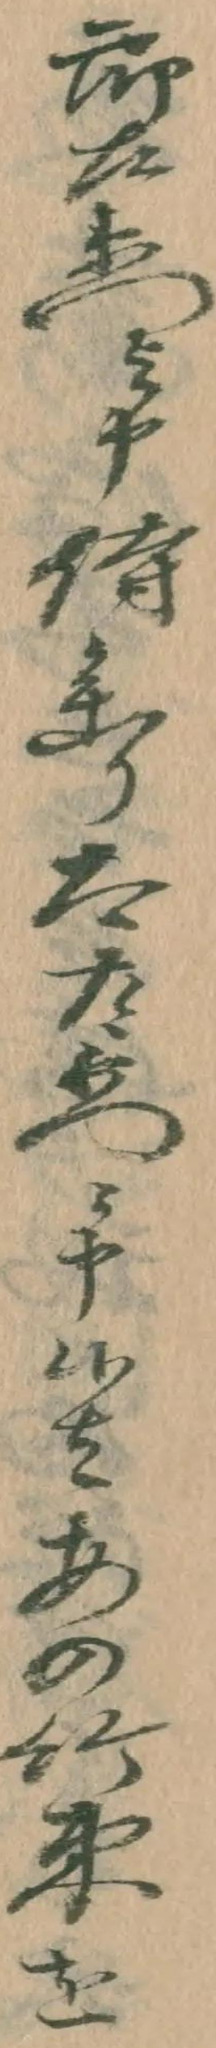郎左衛門と申侍参り太左衛門に申候はあの竹束を
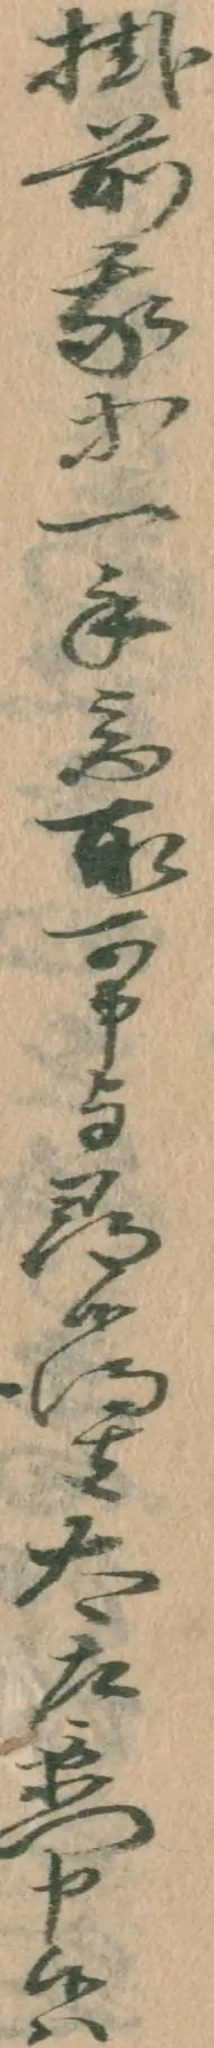掛前我等一手に而取可申と尋候得は太左衛門申候は
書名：切支丹御退治記 49巻. [3]
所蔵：国立国会図書館 National Diet Library, JAPAN
